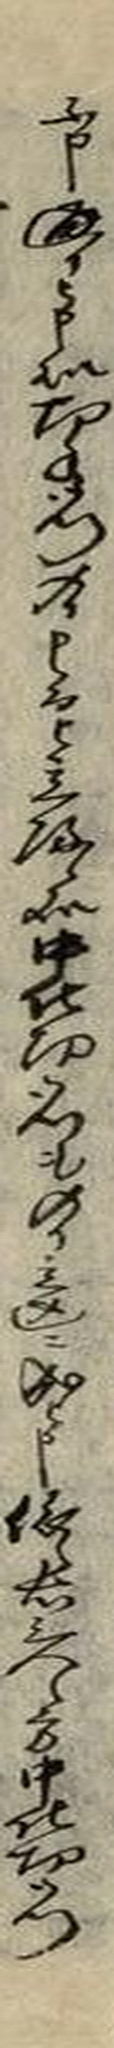不申通り被申候処切手御門〆り申候て被立帰候処中仕切御門も〆り立込に成被申依之右三人之方中仕切御門
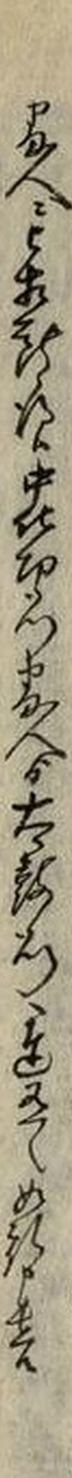番人に被相断候得ハ中仕切御門番ゟ太鼓御門へ達有之如斯申遣候
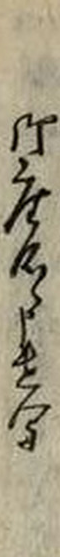御座所へ申遣写
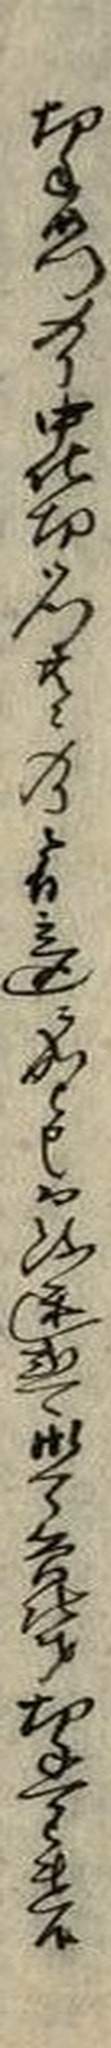切手御門〆り中仕切御門共に〆り候付立込に成被申候て致迷惑候御了簡次第切手可被遣候
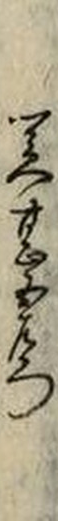関甚五左衛門
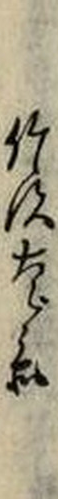竹沢太郎兵衛
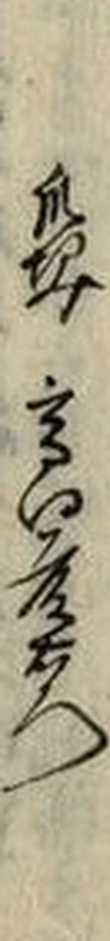爪髪高田藤右衛門
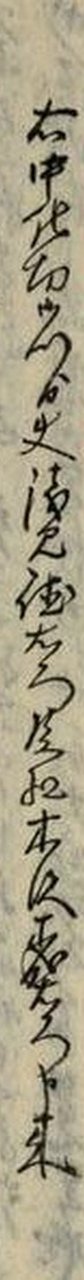右中仕切御門ゟ使浅見徳右衛門殿組木沢森右衛門申来
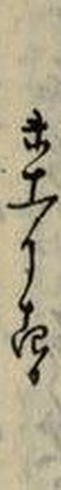未十一月十四日
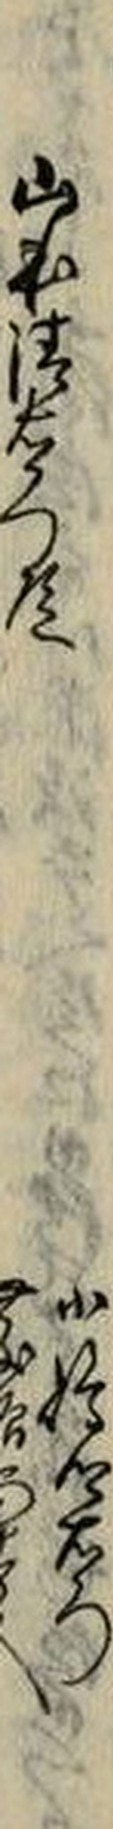山本清右衛門殿小島郷右衛門
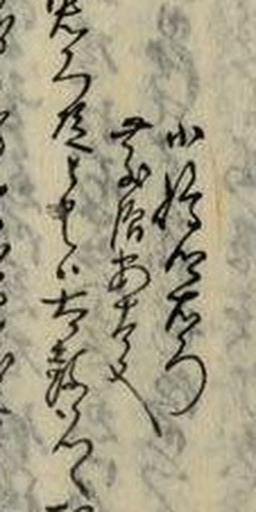慶増安太夫
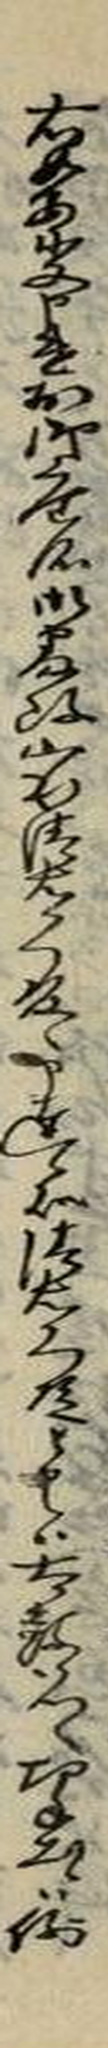右如案文申遣候於御座所御番改山本清右衛門殿へ申達候処清右衛門殿被申候は太鼓御門へ切手出候は例
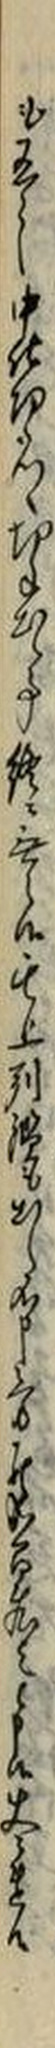も有之中仕切御門へ切手出候事終に無之候其上判鑑も出し不申候へは罷成間敷と被申候使ニ遣候
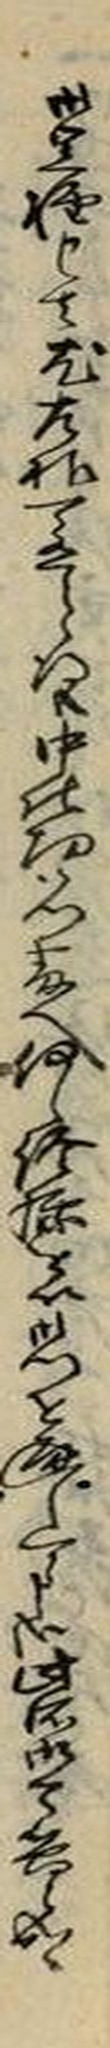御足軽申候は尤左様可有之候得共中仕切御門番人何之証拠を以御門を通可申哉此所御了簡被成候
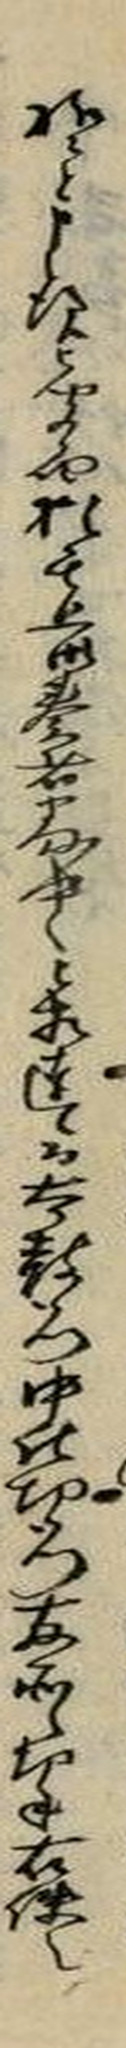様にと申候得は被聞届猶其上御奏者番中へ被相達候て太鼓御門中仕切御門両所之切手右使之
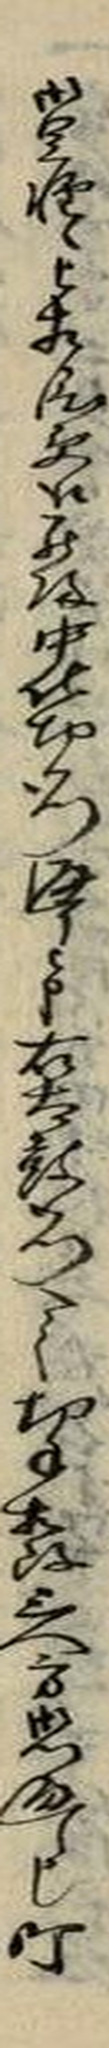御足軽へ被相渡受取罷帰中仕切御門通り被申右太鼓御門へ之切手相改三人方御門通し申候御
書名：御門御櫓之部
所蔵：福井県文書館 Fukui Prefectural Archives
